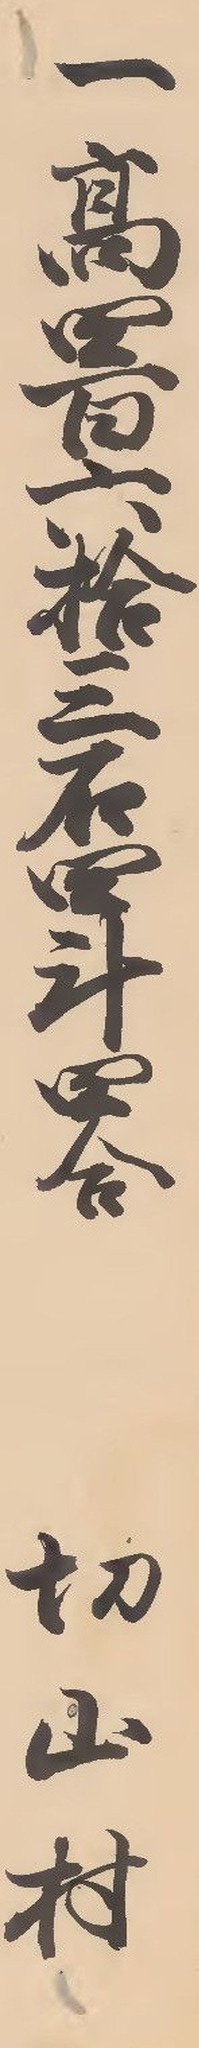一高四百六拾三石四斗四合切山村
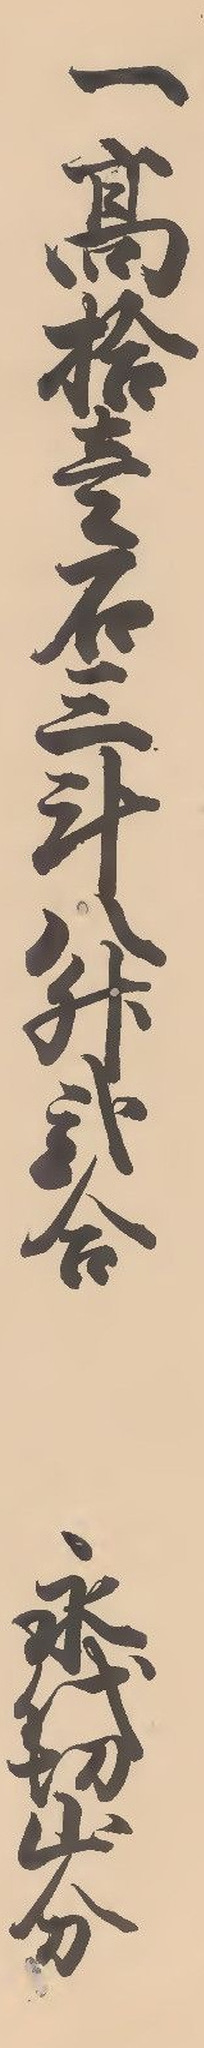一高拾壱石三斗八升弐合永代切山分
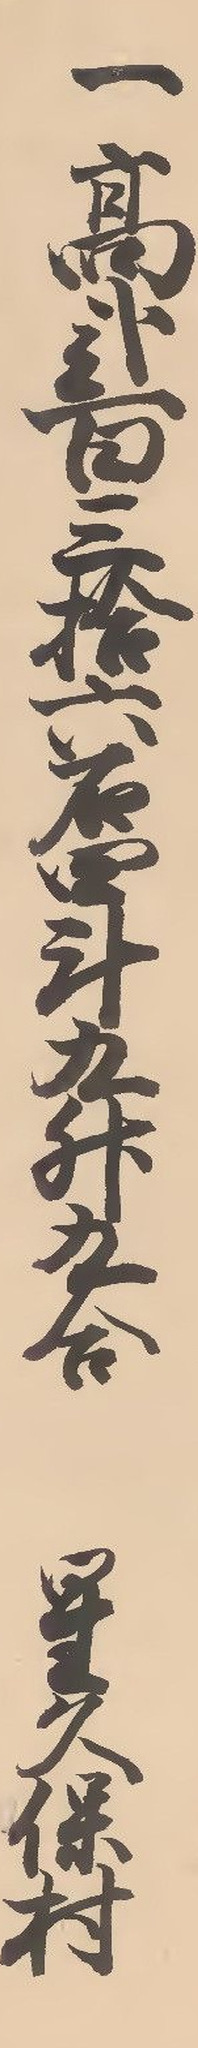一高弐百三拾六石四斗九升九合星久保村
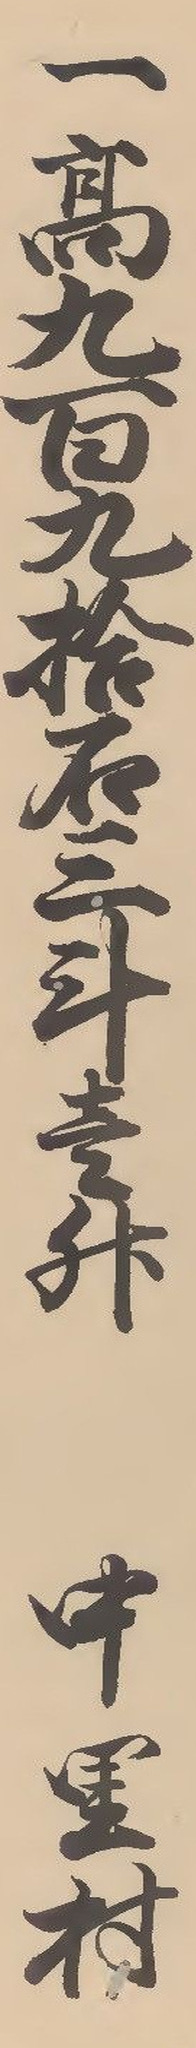一高九百九拾石三斗壱升中里村
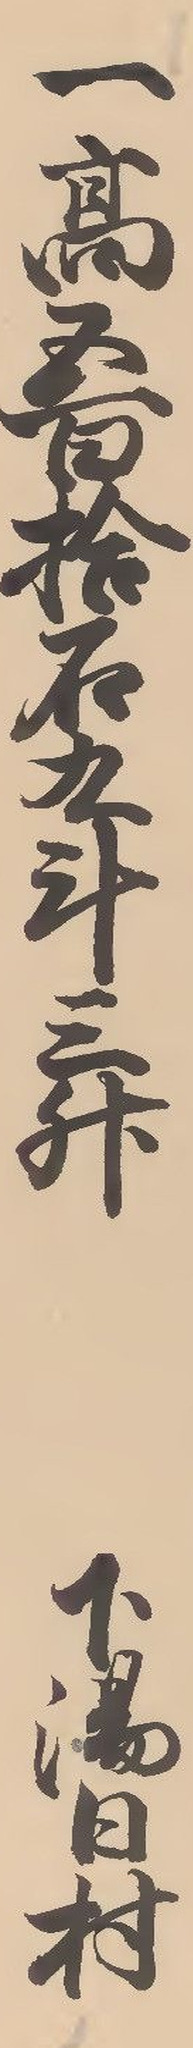一高五百拾石九斗三升下湯日村
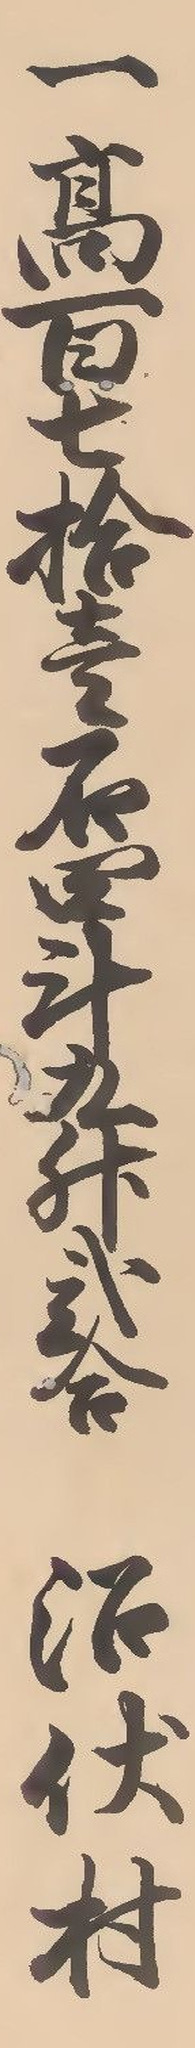一高百七拾壱石四斗九升弐合沼伏村

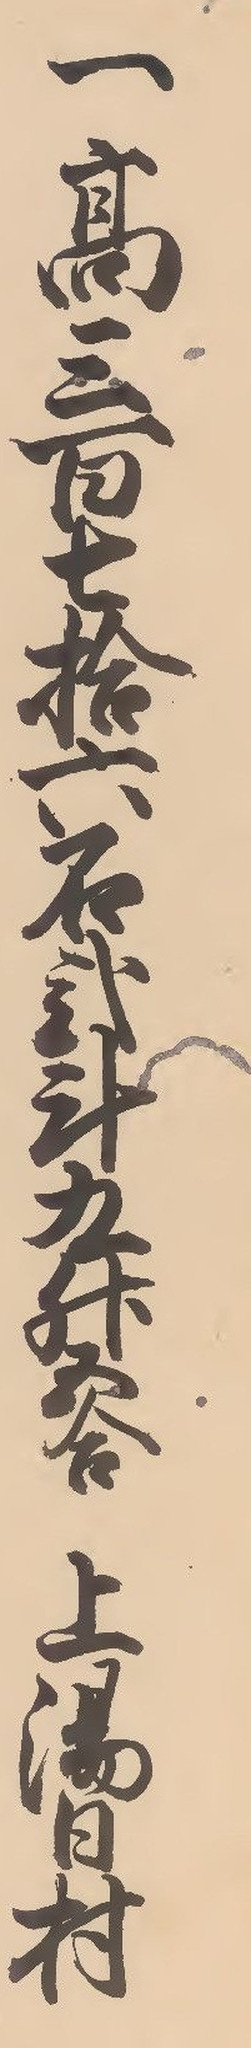一高三百七拾六石弐斗九升五合上湯日村
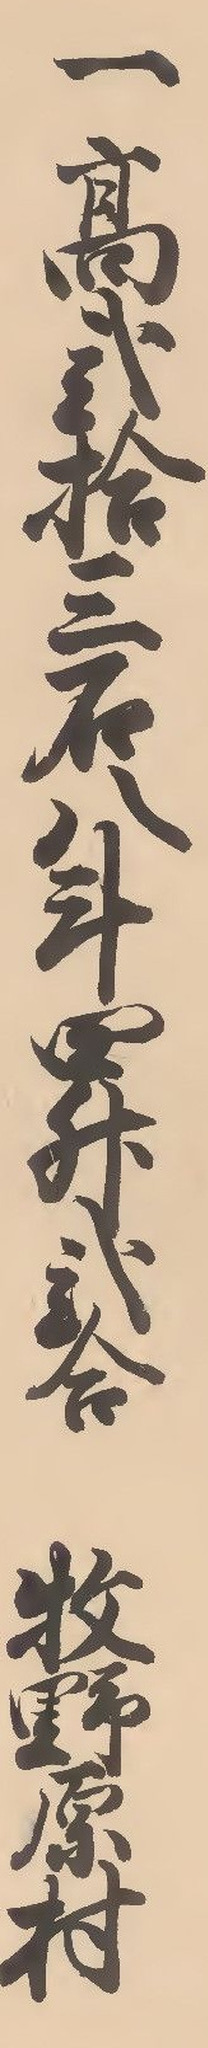一高弐拾三石八斗四升弐合牧野原村
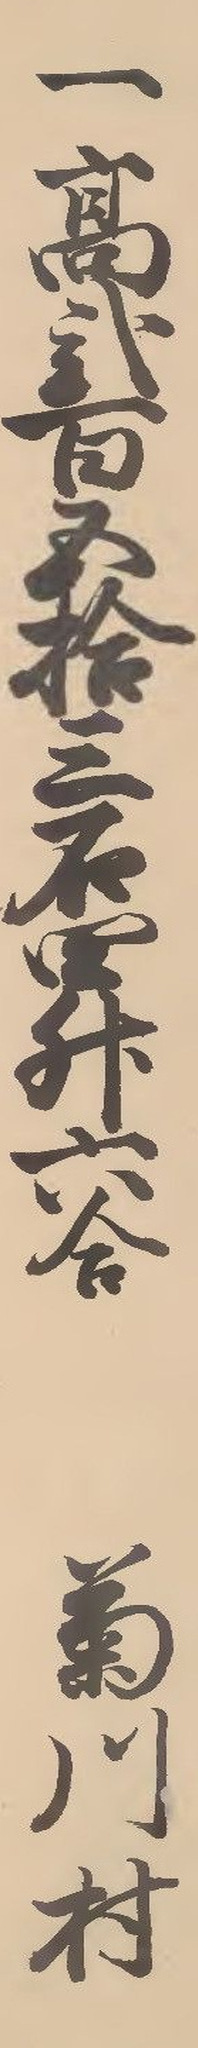一高弐百五拾三石四升六合菊川村
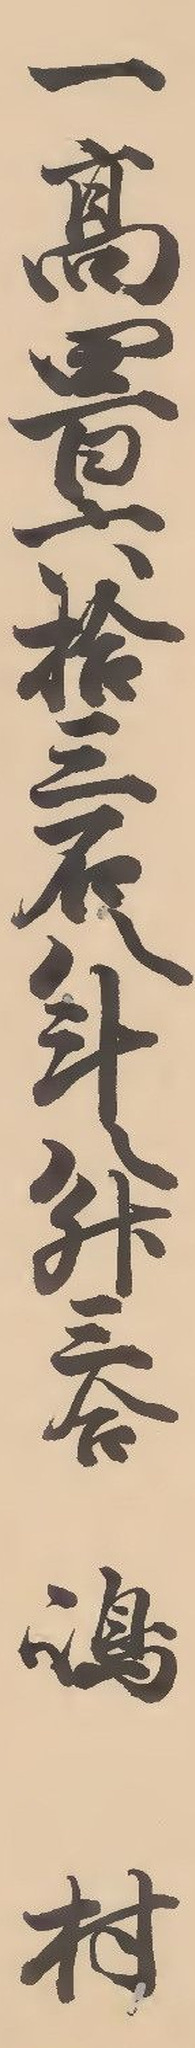一高四百六拾三石八斗八升三合島村
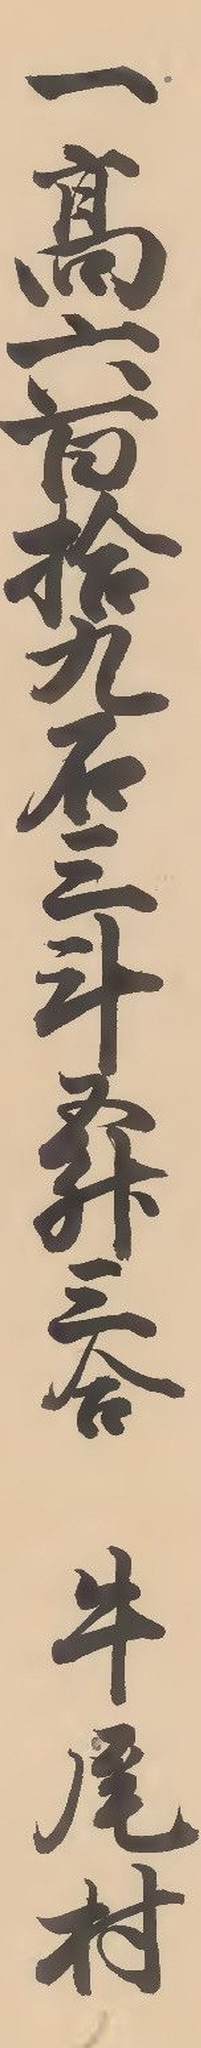一高六百拾九石三斗五升三合牛尾村
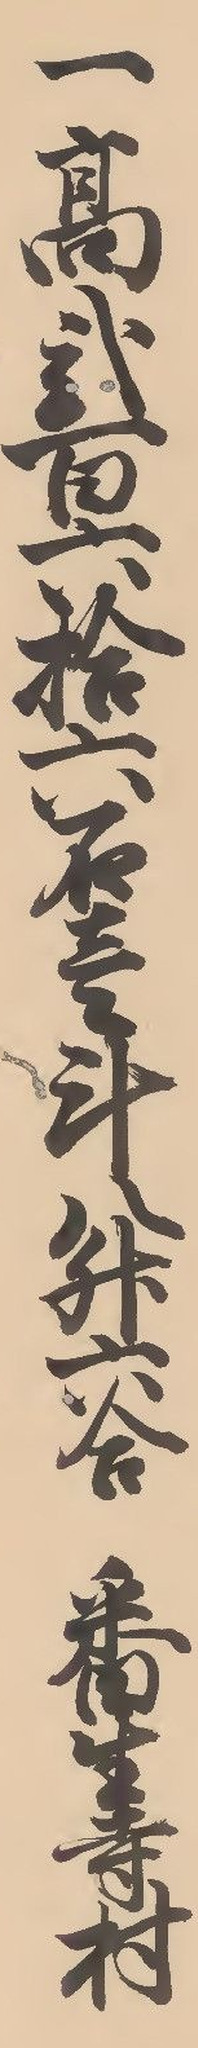一高弐百拾六石壱斗八升六合番生寺村

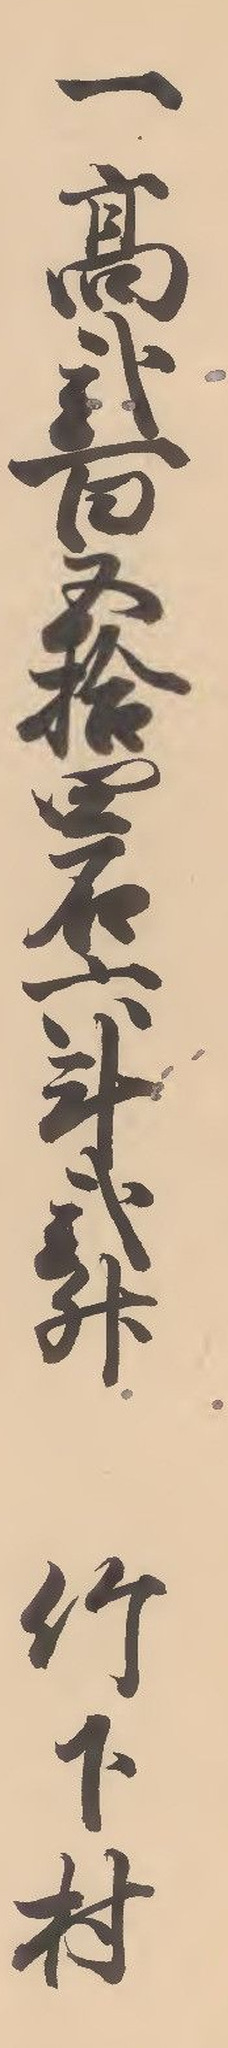一高弐百五拾四石六斗弐升竹下村
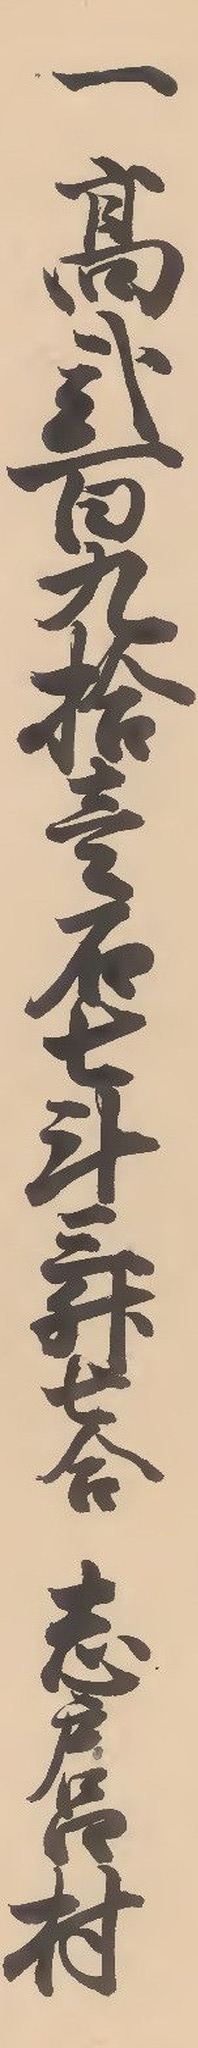一高弐百九拾壱石七斗三升七合志戸呂村
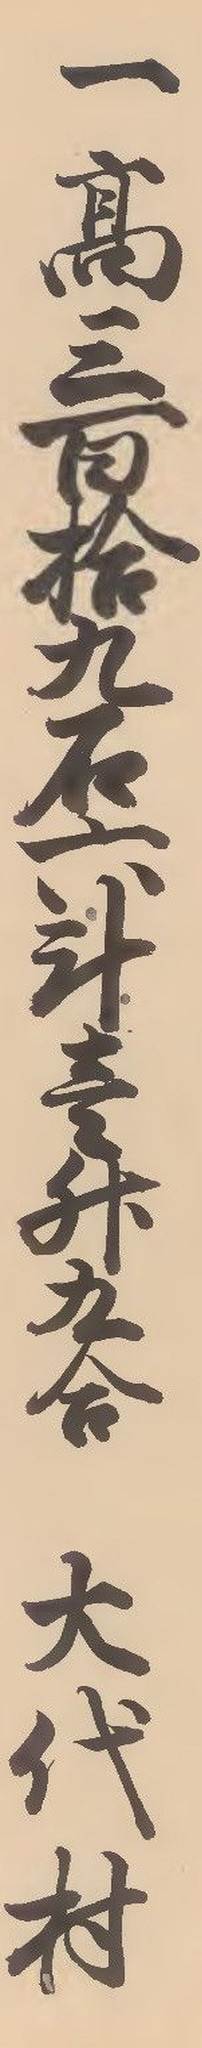一高三百拾九石六斗壱升九合大代村
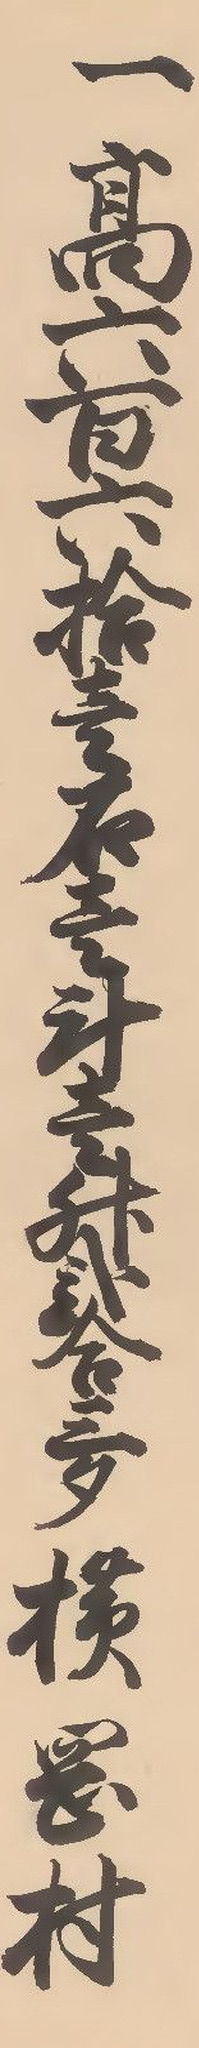一高六百六拾壱石壱斗壱升弐合三勺横岡村
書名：遠江国郷帳
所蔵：国立公文書館 National Archives of Japan
